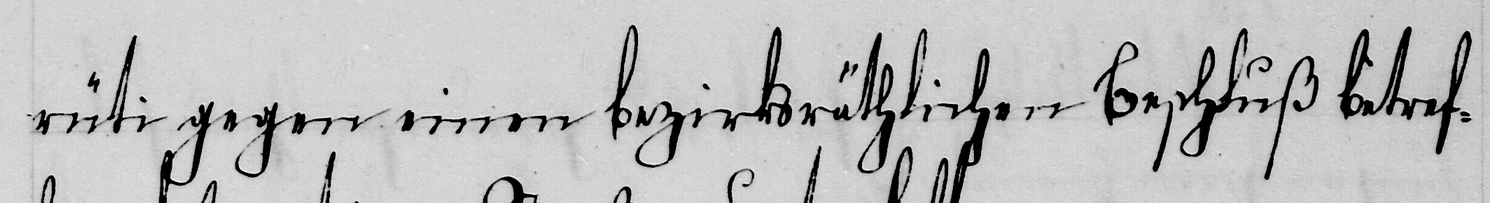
rüti gegen einen bezirksräthlichen Beschluß betref¬
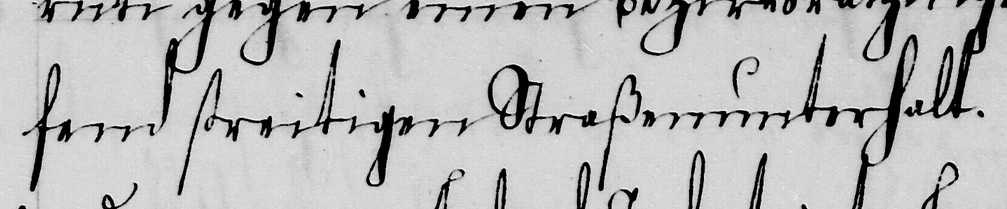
fend streitigen Straßenunterhalt.
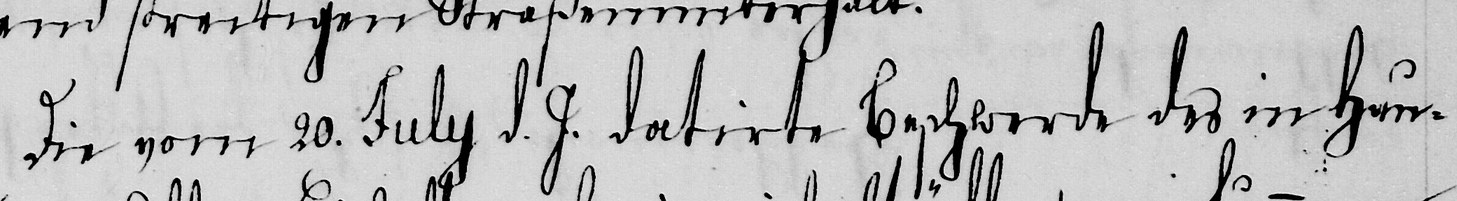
Die vom 20. July d. J. datirte Beschwerde des in Hau¬
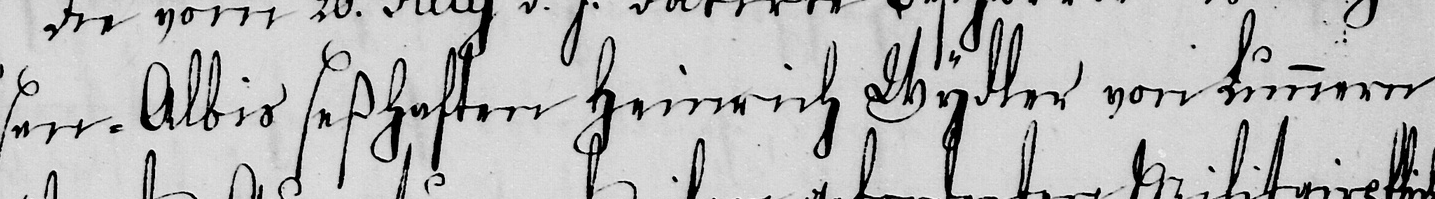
sen-Albis seßhaften Heinrich Wydler von Lunnern
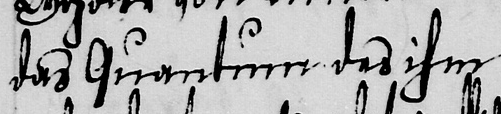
das Quantum des ihm
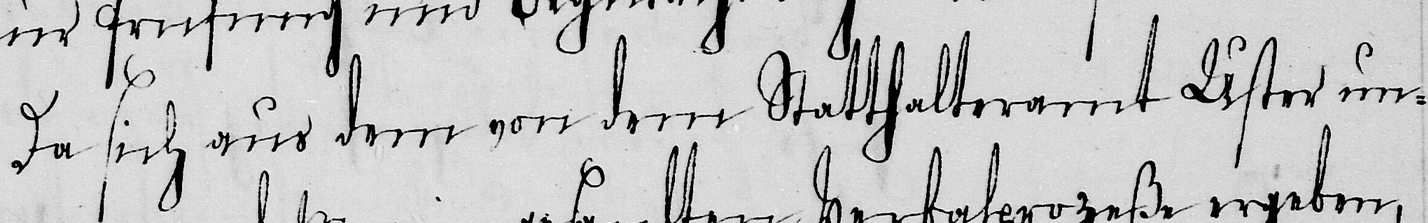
Da sich aus dem von dem Statthalteramt Uster un¬
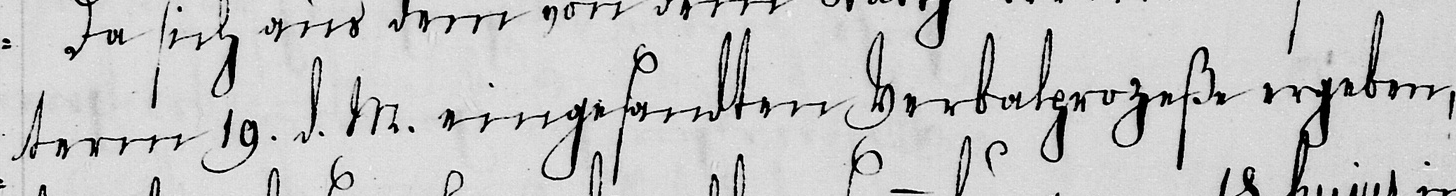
term 19. d. M. eingesandten Verbalproceße ergeben,
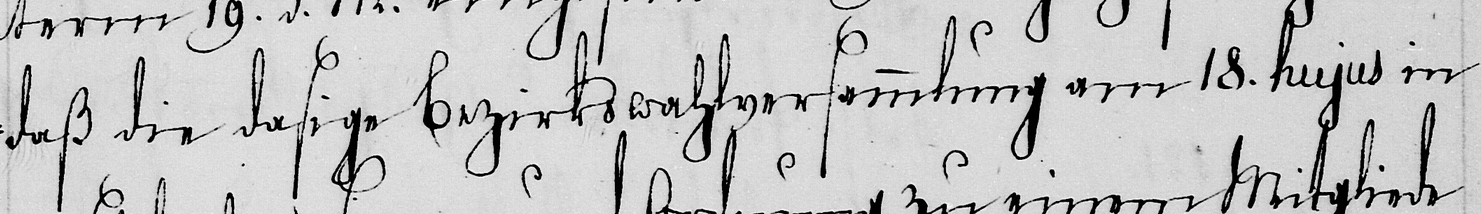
daß die dasige Bezirkswahlversammlung am 18. hujus in
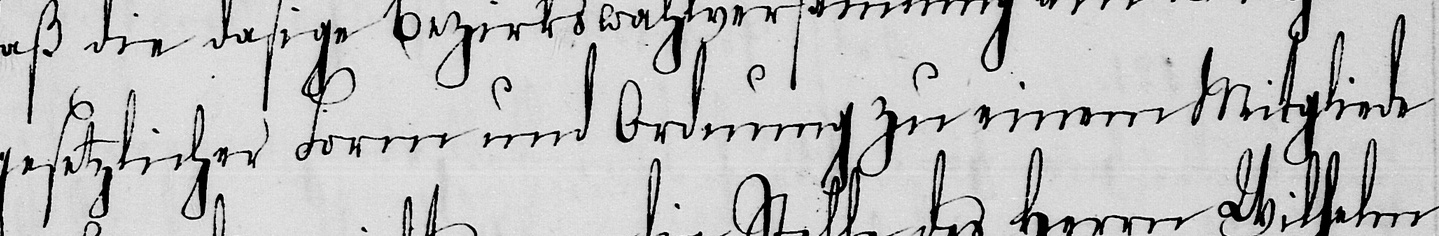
gesetzlicher Form und Ordnung zu einem Mitgliede
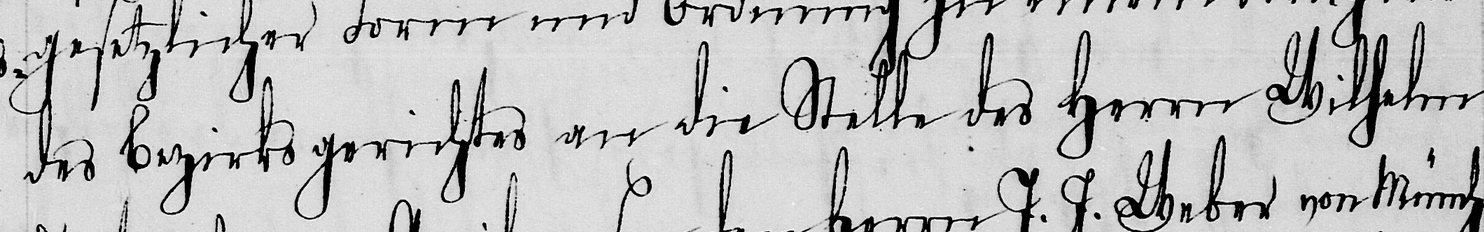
des Bezirksgerichtes an die Stelle des Herrn Wilhelm
